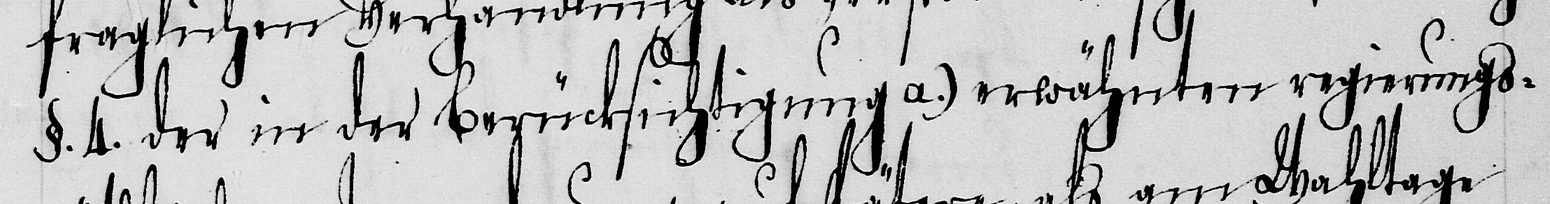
§. 4. der in der Berücksichtigung a.) erwähnten regierungs¬
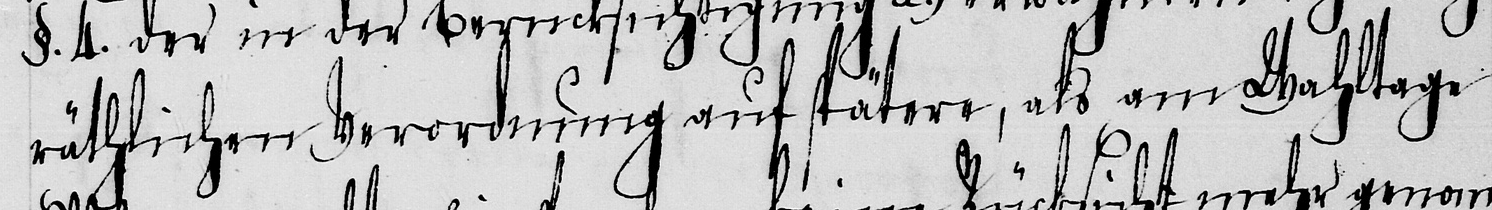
räthlichen Verordnung auf spätere, als am Wahltage
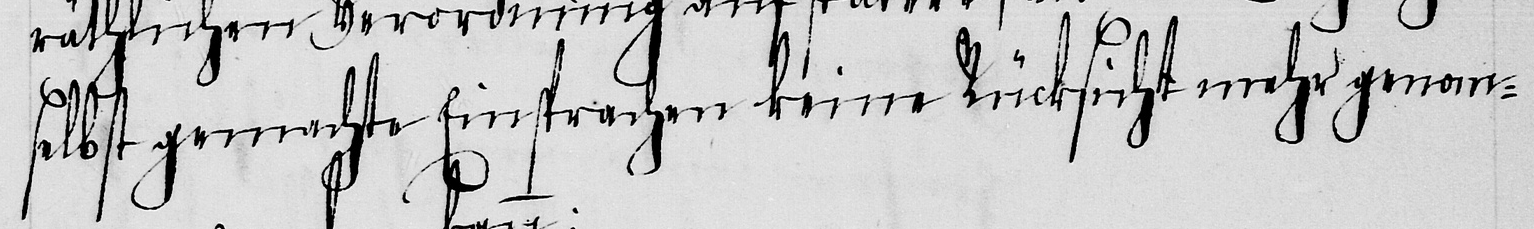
selbst gemachte Einsprachen keine Rücksicht mehr genom¬
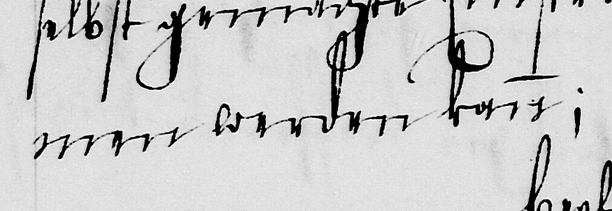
men werden kann;
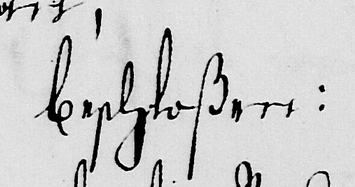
beschloßen:
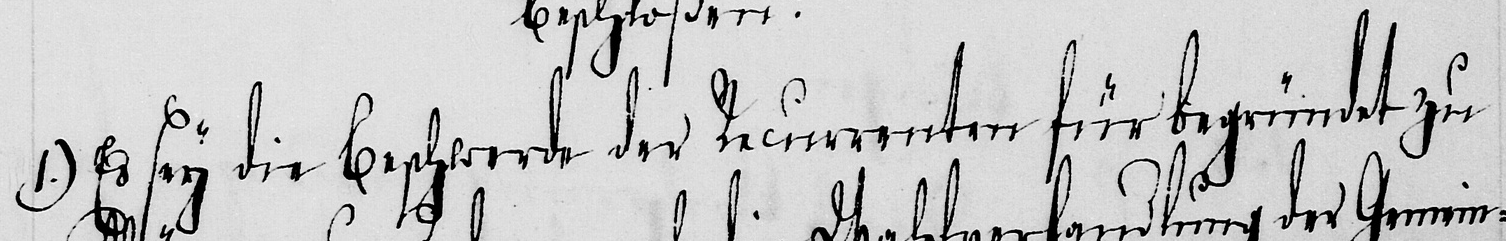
Es sey die Beschwerde der Recurrenten für begründet zu
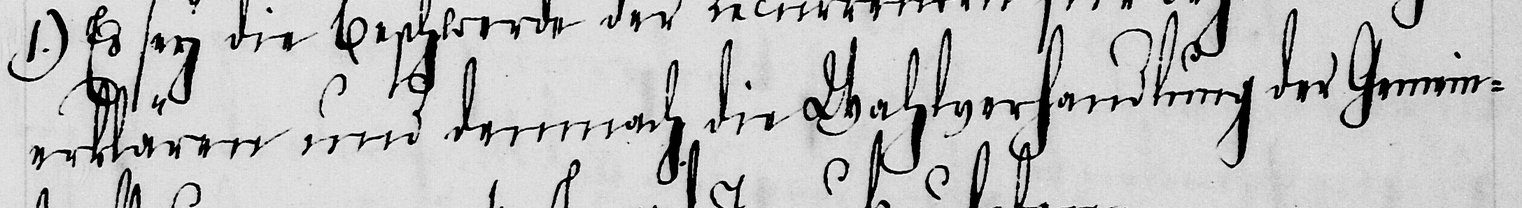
erklären und demnach die Wahlverhandlung der Gemein¬
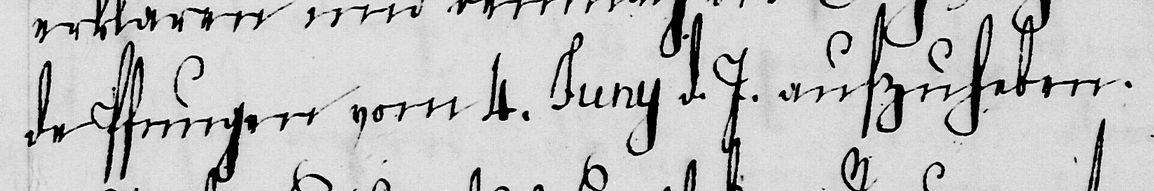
de Pfungen vom 4. Juny d. J. aufzuheben.
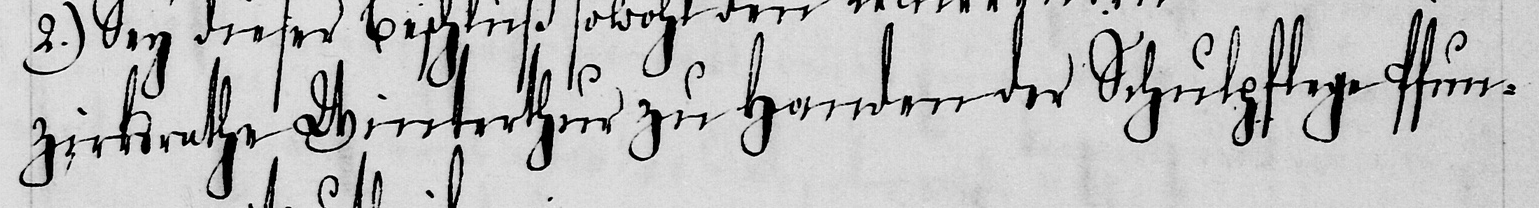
zirksrathe Winterthur zu Handen der Schulpflege Pfun¬
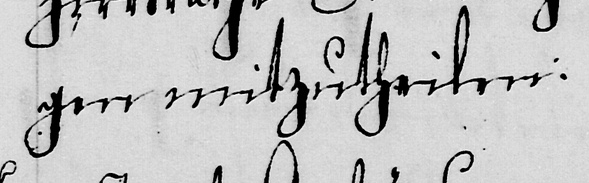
gen mitzutheilen.
